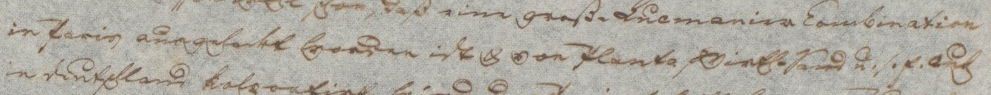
in Paris ausgeheckt worden ist & von Planta, Wirth-Sand u. s. f. auch
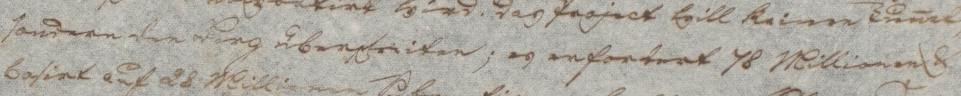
sondern den Berg überschreiten; es erfordert 78 Millionen &
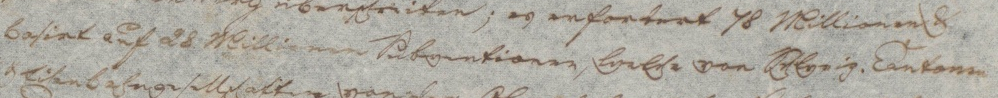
basirt auf 28 Millionen Subventionen, welche von Schweiz. Cantonen
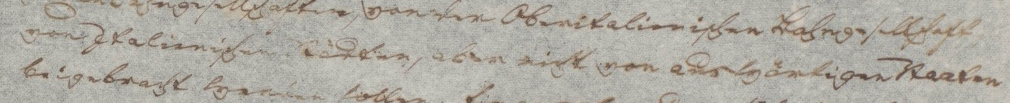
von Italienischen Städten, aber nicht von auswärtigen Staaten
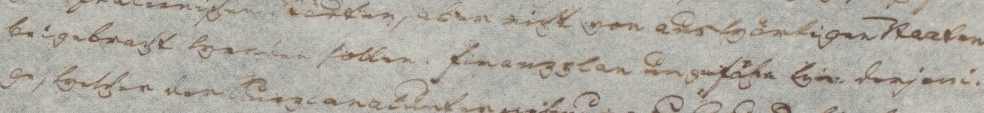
beigebracht werden sollen. Finanzplan ungefähr wie derjeni-
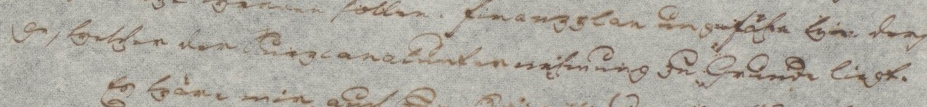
ge, welcher der Suezcanalunternehmung zu Grunde liegt.
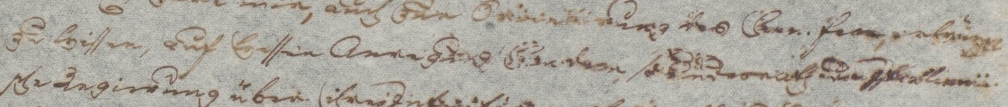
zu wissen, auf wessen Anregung hin der Bundesrath die Italieni-
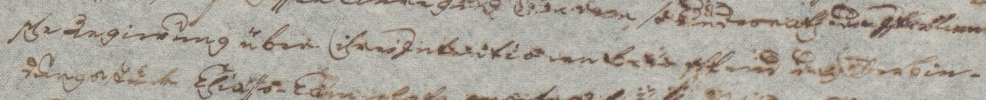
sche Regierung über ihre Intentionen betreffend das Verbin-
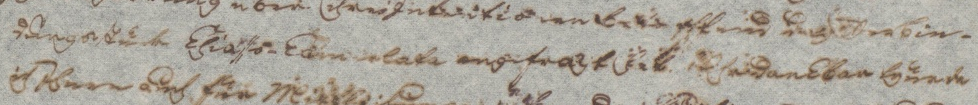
dungsstück Chiasso–Camerlata angefragt hat. Sehr dankbar würde
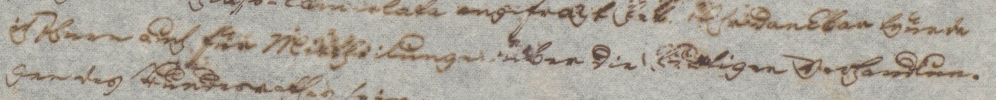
ich Ihnen auch für Mittheilungen über die heutigen Verhandlun-
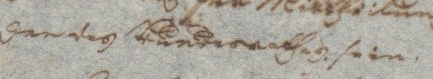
gen des Bundesrathes sein.
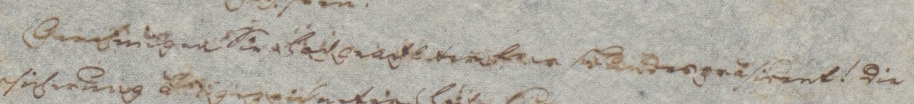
Genehmigen Sie, Hochgeachteter Herr Bundespräsident! die
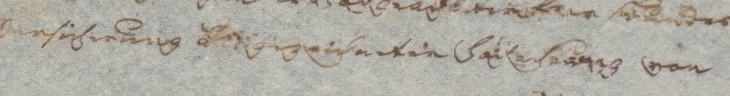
Versicherung ausgezeichneter Hochachtung von
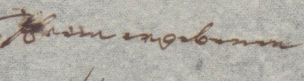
Ihrem ergebenen
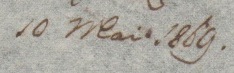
10. Mai 1869.
